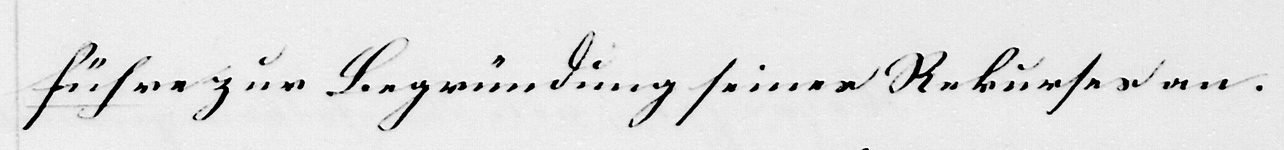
führe zur Begründung seines Rekurses an.
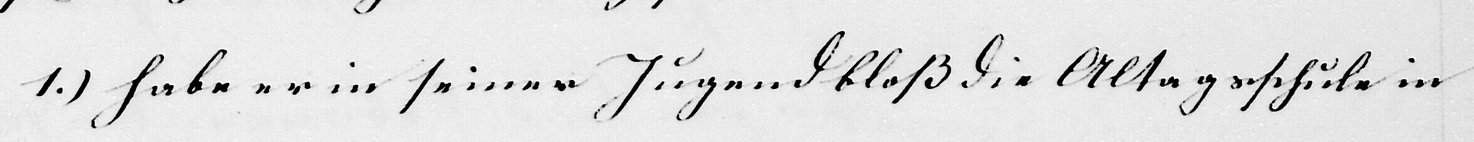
1.) Habe er in seiner Jugend bloß die Altagsschule in
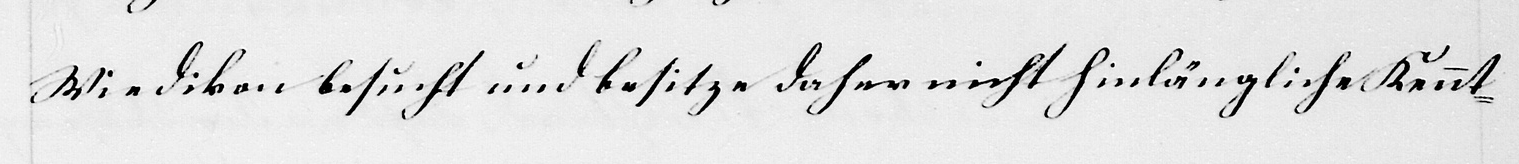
Wiedikon besucht und besitze daher nicht hinlängliche Kennt¬
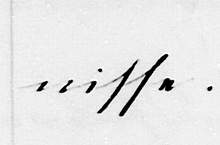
nisse.
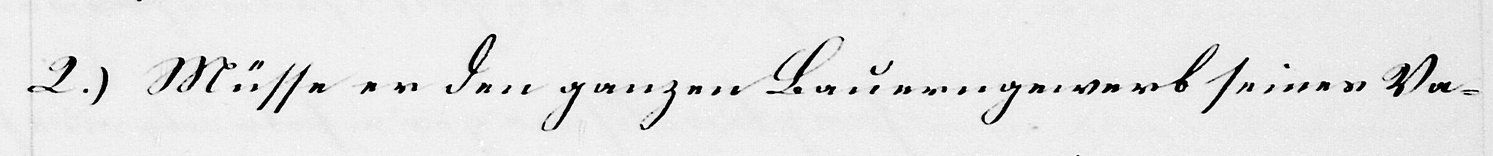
2.) Müsse er den ganzen Bauerngewerb seines Va¬
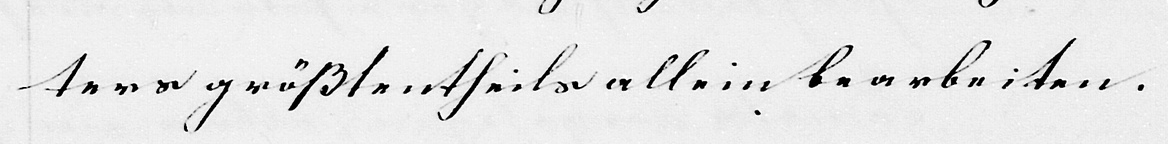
ters größtentheils allein bearbeiten.
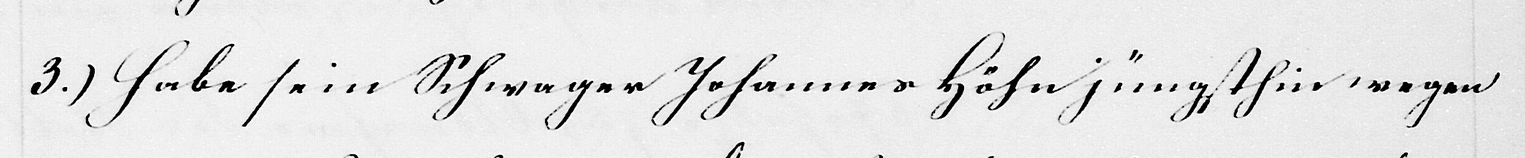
3.) Habe sein Schwager Johannes Höhn jüngsthin wegen
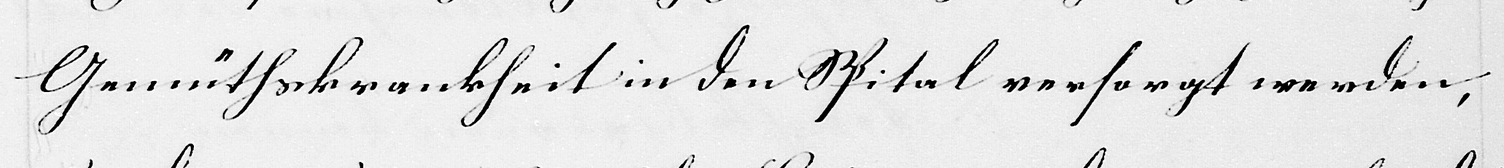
Gemüthskrankheit in den Spital versorgt werden,
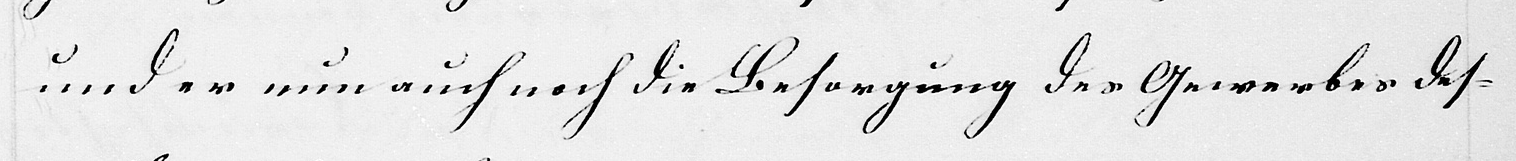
und er nun auch noch die Besorgung des Gewerbes des¬
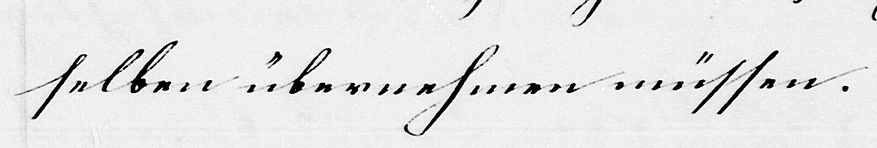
selben übernehmen müssen.
